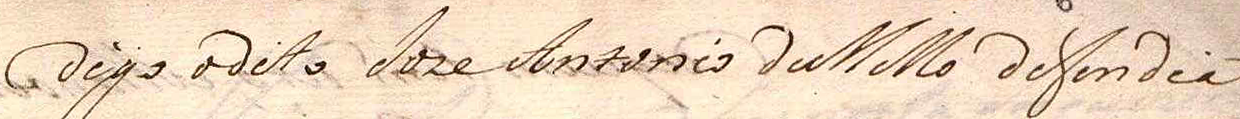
digo o dito Ioze Antonio de Mello defendia
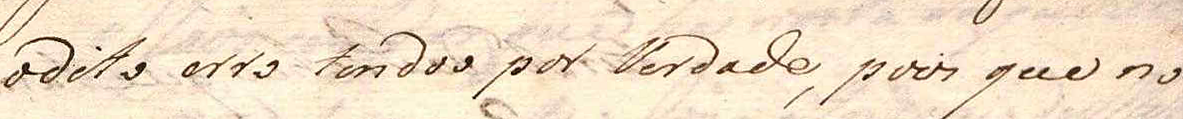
o dito erro tendoo por Verdade, pois que no
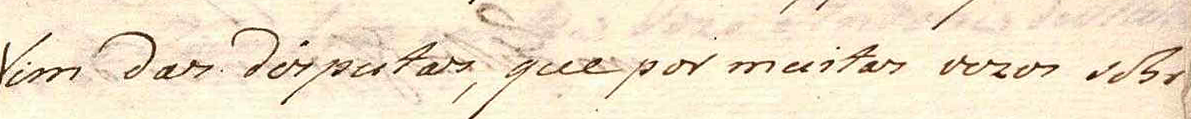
fim das disputas, que por muitas vezes sobr
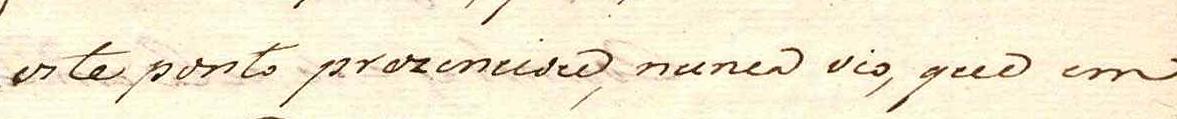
este ponto prezenciou, nunca vio, que em
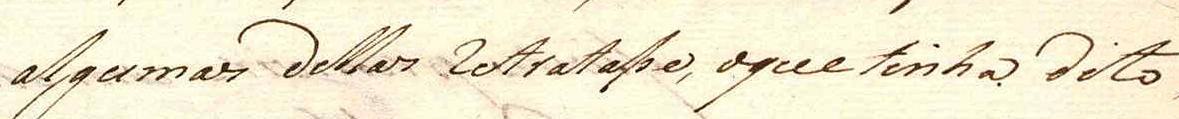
algumas dellas RetrataSse, o que tinha dito,
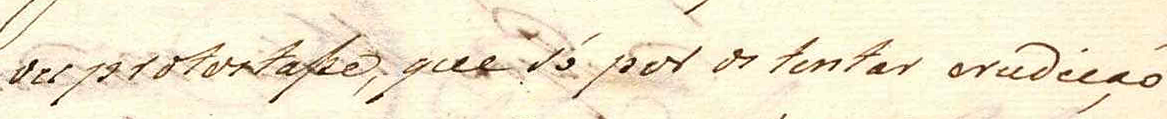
ou protestaSse, que só por os tentar erudiçaõ
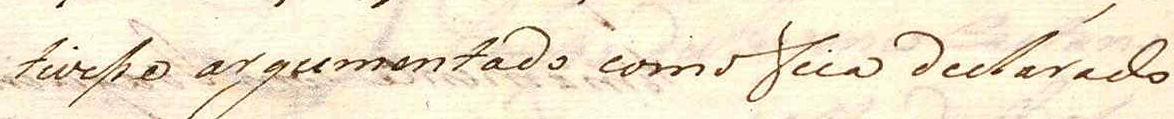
tivesse argumentado como fica declarado.
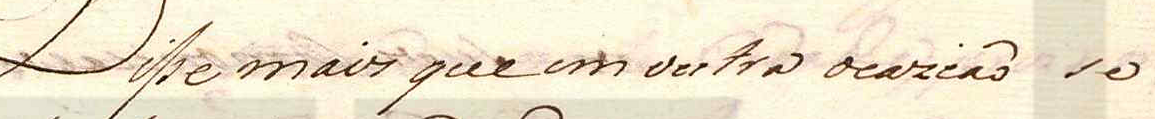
Disse mais que em outra ocaziaõ se
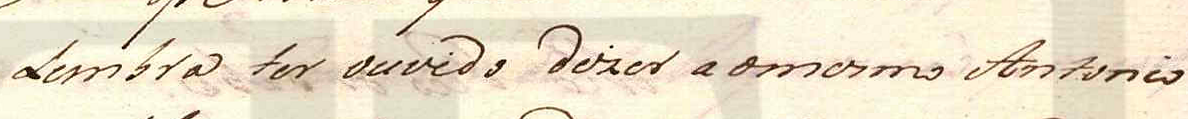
Lembra ter ouvido dizer a o mesmo Antonio
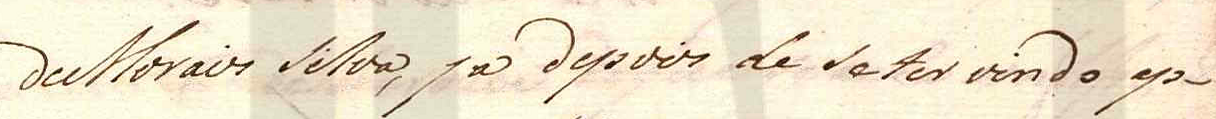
de Morais Silva, ja depois de se ter vindo ap
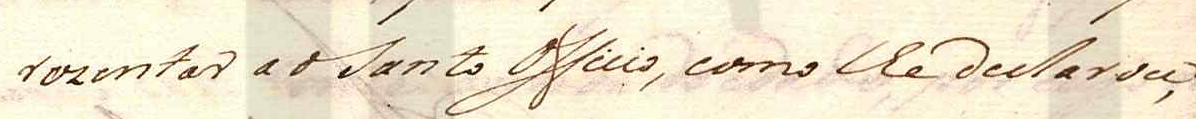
rezentar a o Santo Officio, como lhe declarou,
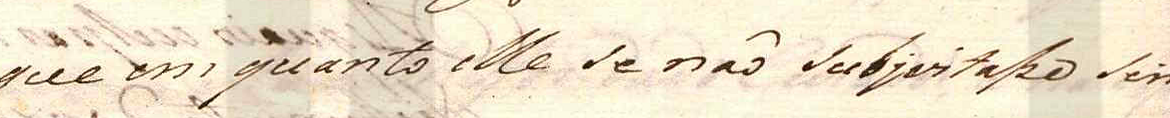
que emquanto elle se naõ subjeitaSse sin
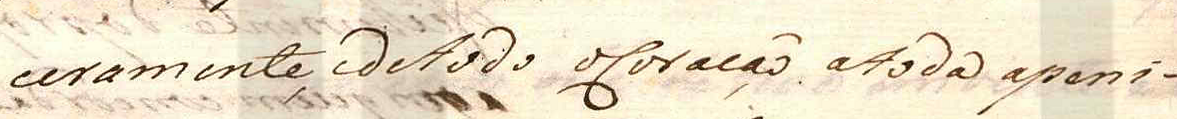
ceramente, e de todo o Coraçaõ a toda a peni
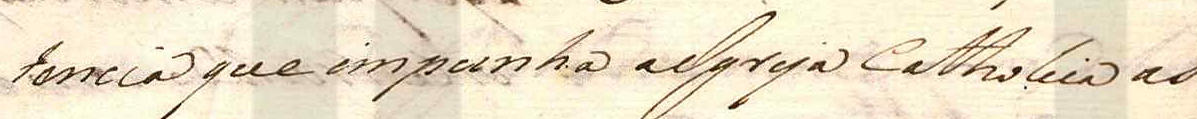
tencia que impunha a Igreja Catholica as
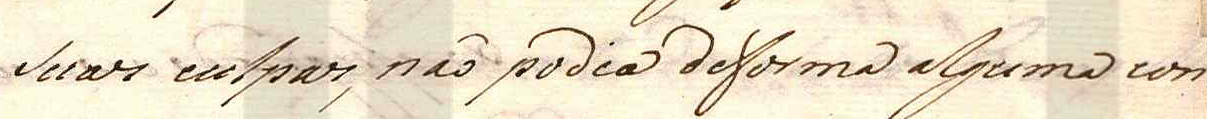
suas culpas, naõ podia de forma alguma con
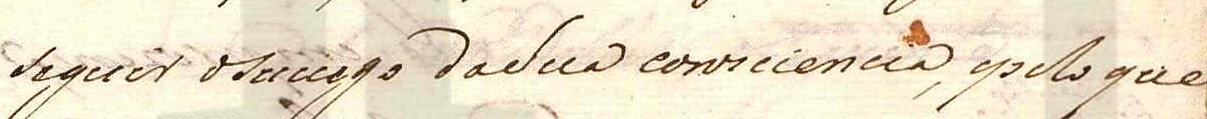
seguir o succego da Sua consciencia, e pelo que
